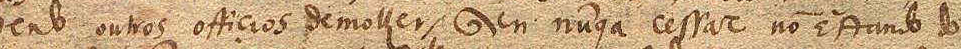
zendo outros offiçios de molher / sen nūqa cessar nō Estando do
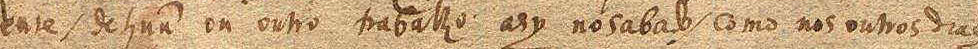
ente / de huū ou outro trabalho asy no sabado / como nos outros dias
